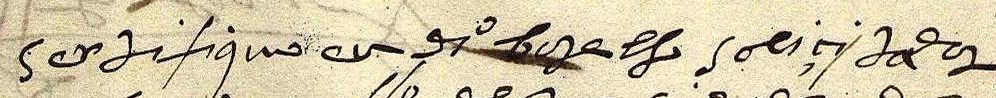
sertifiquo eu dio botelho soliçytador
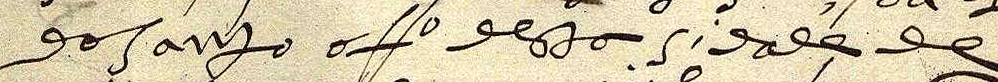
do santo offo desta sidade de
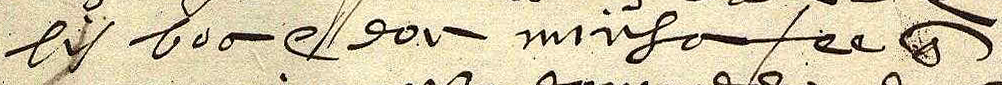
lisboa e dou minha fee q̄
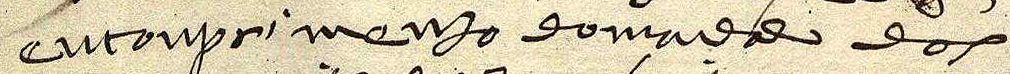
en conprimento do madado dos
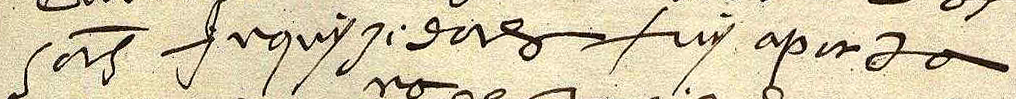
sōrs jnquyzidores fuy a porta
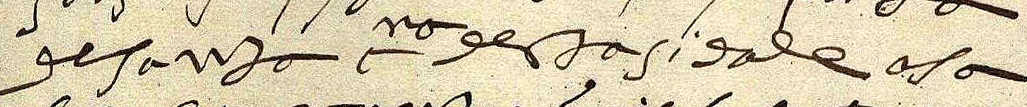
de santa cna desta sidade a sa
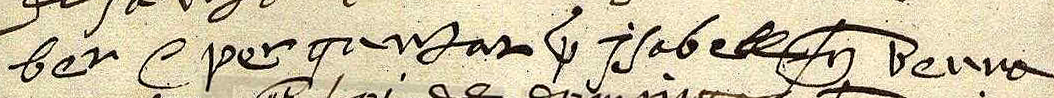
ber e perguntar p̄o jsabell frz̄ veuua
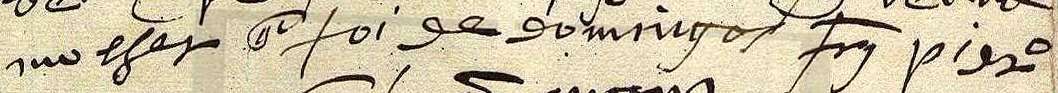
molher q̄ foi de domingos fr̄z pidro
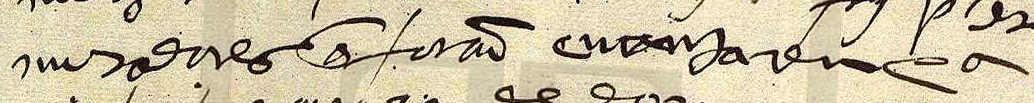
moradores q̄ foraõ en cantaren e a
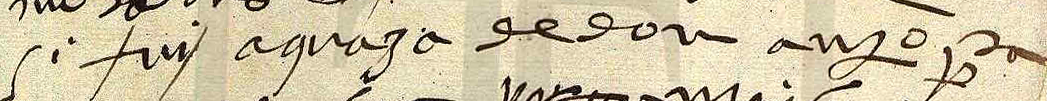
si fuy a quaza de don anto pra
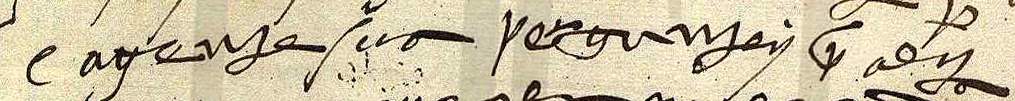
e a gente sua perguntey p̄o a dita
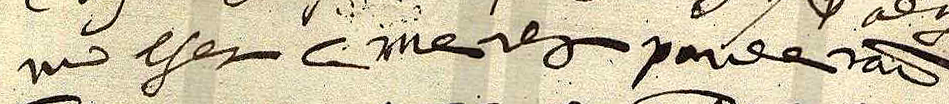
molher e me responderaõ
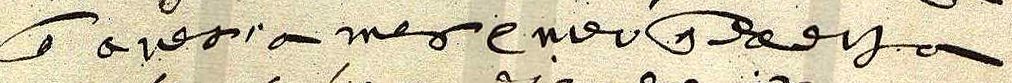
q̄ aueria mes e meo q̄ da dita
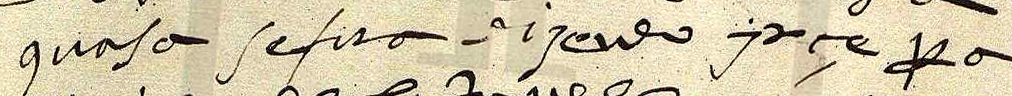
quasa se fora dizendo jrçe ꝑa
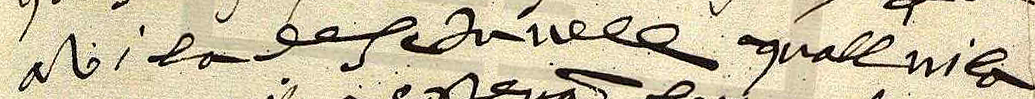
a vila de setuuell a quall uila
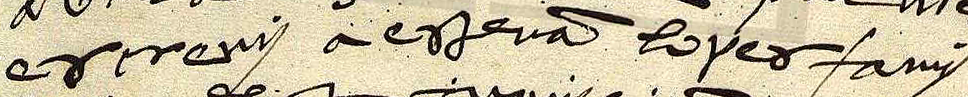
escreuy a esteuaõ lopes famy
